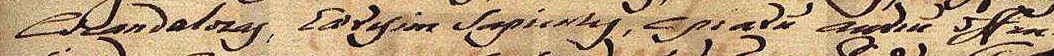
Escandalozas, hæresim sapientes, e piarū auditē offen
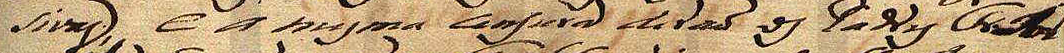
sivas; e a mesma censura deraõ os Padres Fr. Ior
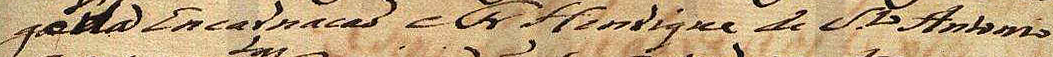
ge da Encarnaçaõ, e Fr Henrique de S.to Antonio
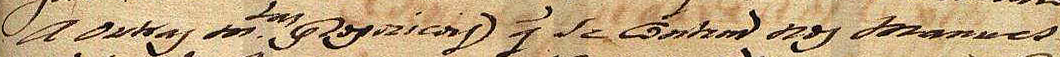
A outras m.tas propoziçois q̄ se contam nos manus
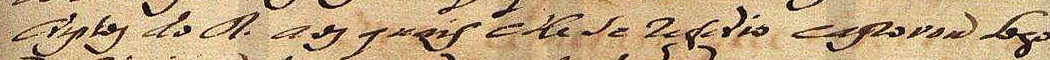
Criptos do R. aos quais elle se referio e aprovou Logo
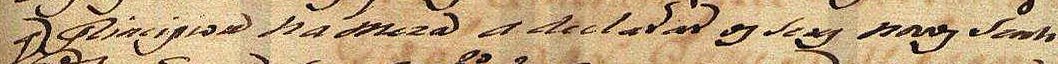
q̄ principiou na meza a declarar os seus novos senti
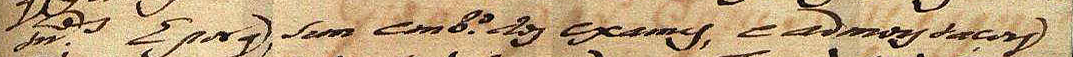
m.tos E porq̄, sem emb.o dos exames, e admoestaçois
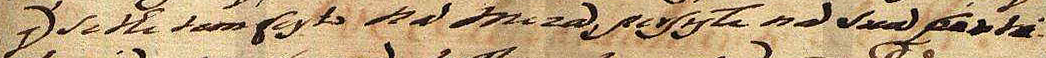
q̄ se lhe tem feyto na meza, persiste na sua contu
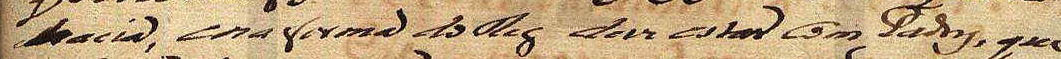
macia, e na forma do Reg deve estar com Padres, que
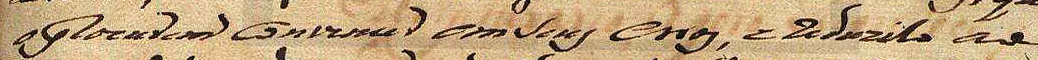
o pRocurem convencer em seus erros, e Reduzido ao
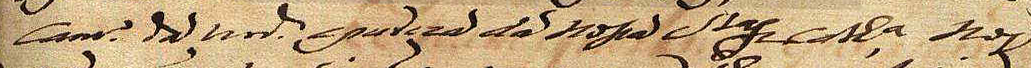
Cam.o da verd.e a pureza da nossa Sta fe cath,a nos
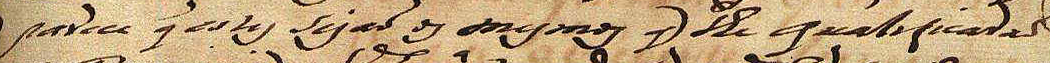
parece q̄ estes sejaõ os mesmos q̄ lhe qualificaraõ
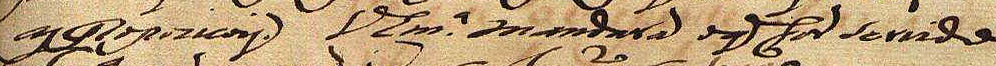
as propoziçois. V Em.a mandara o q̄ for servido
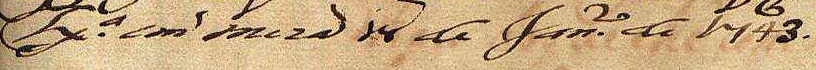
Lx.a em meza i8 de Jan.ro de 1743.
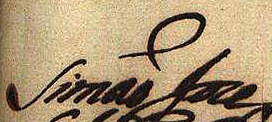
Simaõ Joze
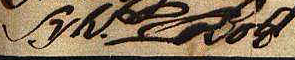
Sylvr.o Lobo
